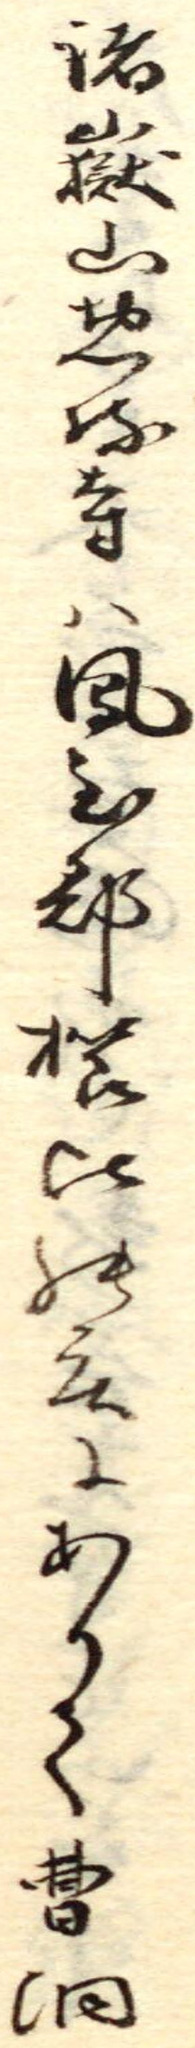諸嶽山惣持寺は鳳至郡櫛比の庄にありて曹洞
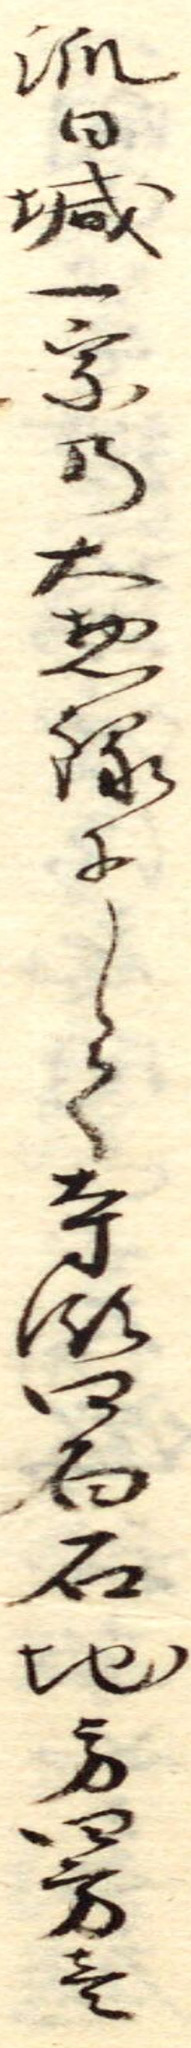流日域一宗の大惣録にして寺領四百石地方四方壱
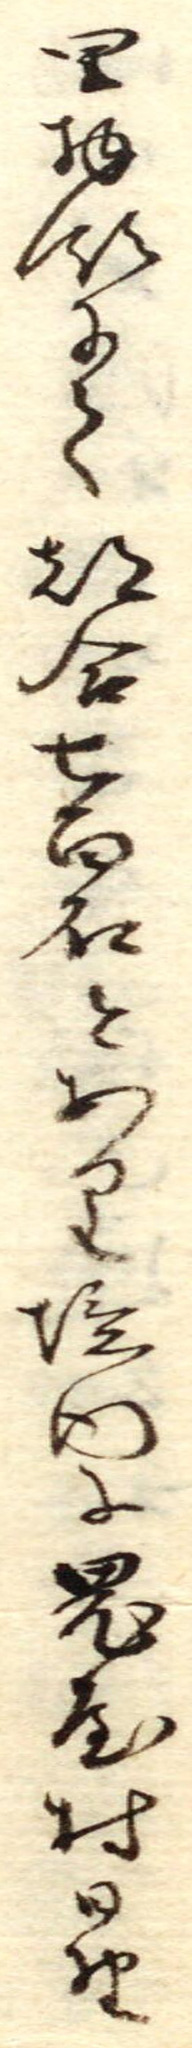里拝領にて都合七百石とあり境内に鬼屋村日野
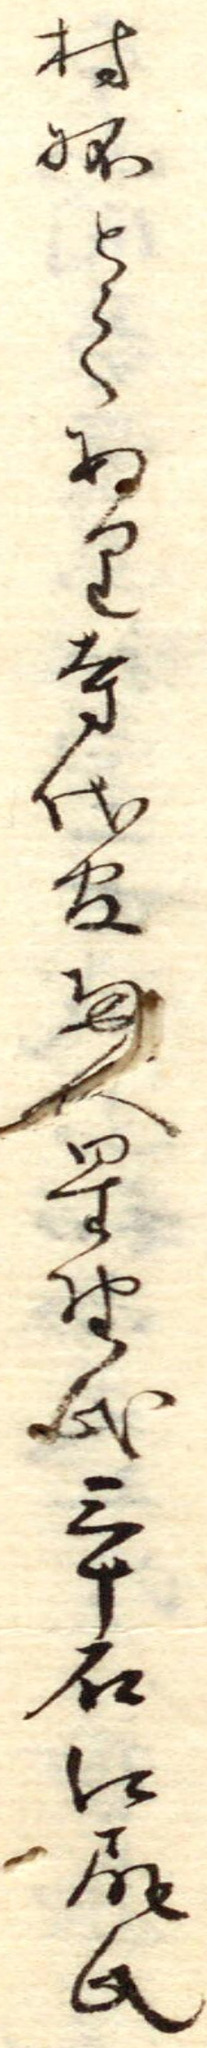村抔とてあり寺代官両人星野氏三十石江尻氏
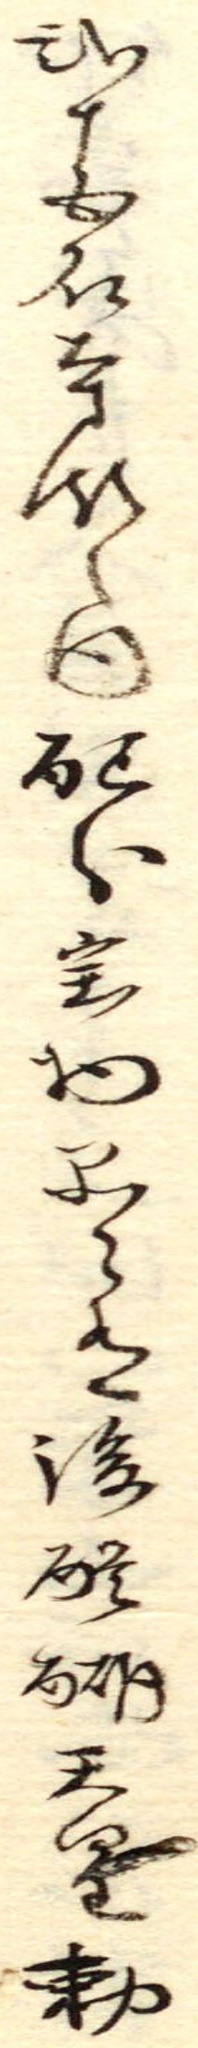弐十五石寺領之内配分宝物品々有御醍醐天皇勅
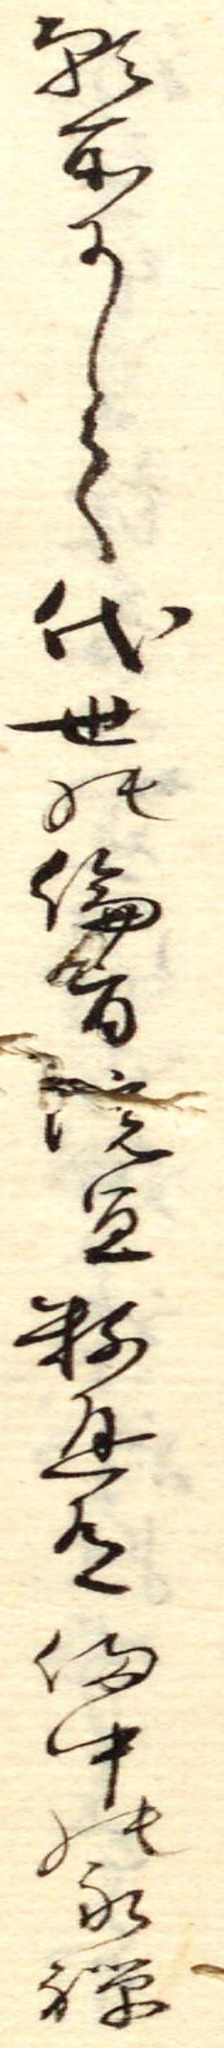願所にして代世の綸旨院宣数通有備中の永禅
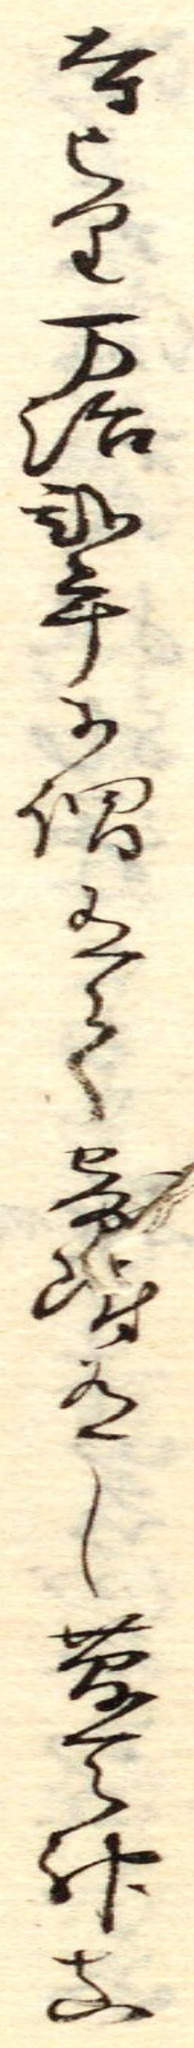寺より万治弐年に謂有て寄附有し菅天神真
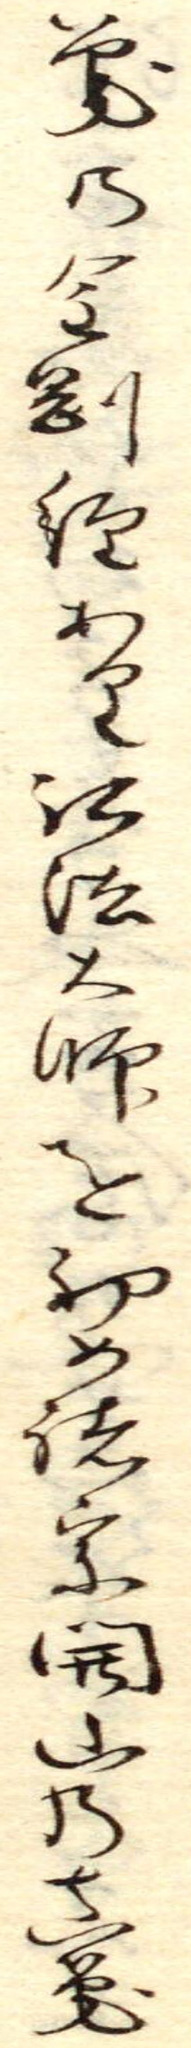筆の金剛経あり弘法大師を初め諸宗開山の真筆
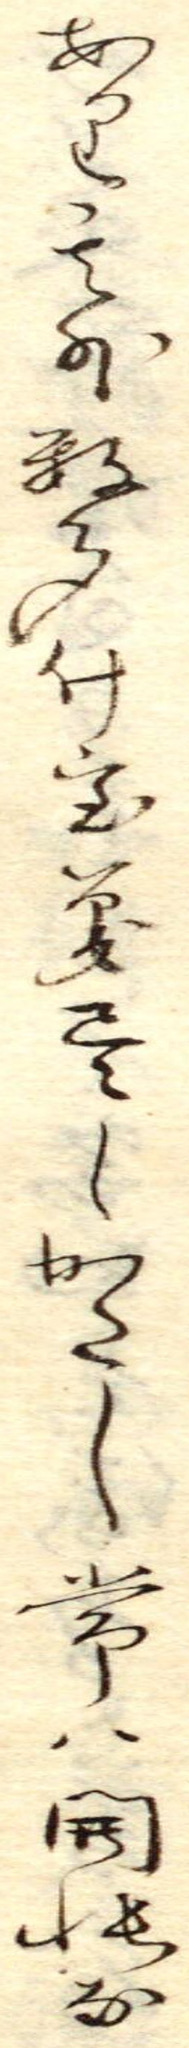あり其外数多什宝筆尽しかたし常は開帳な

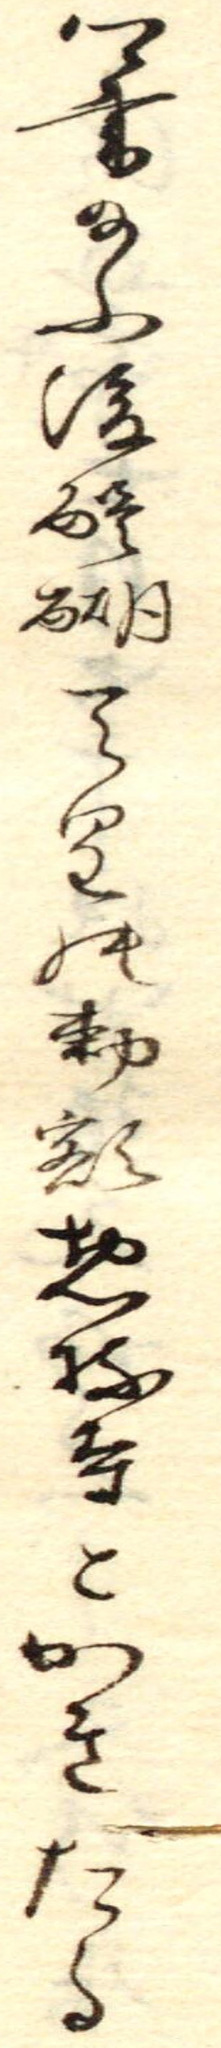卿書給ふ後醍醐天皇の勅額惣持寺とかきたる
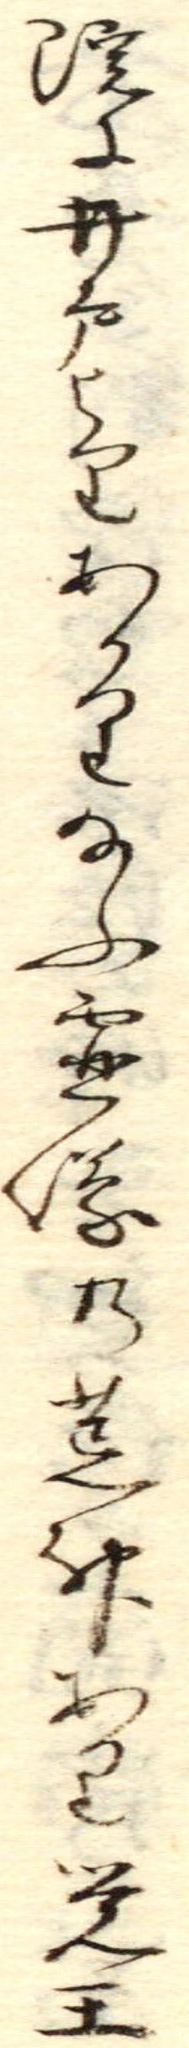院に井戸よりあかり給ふ霊像の荒神あり覚王
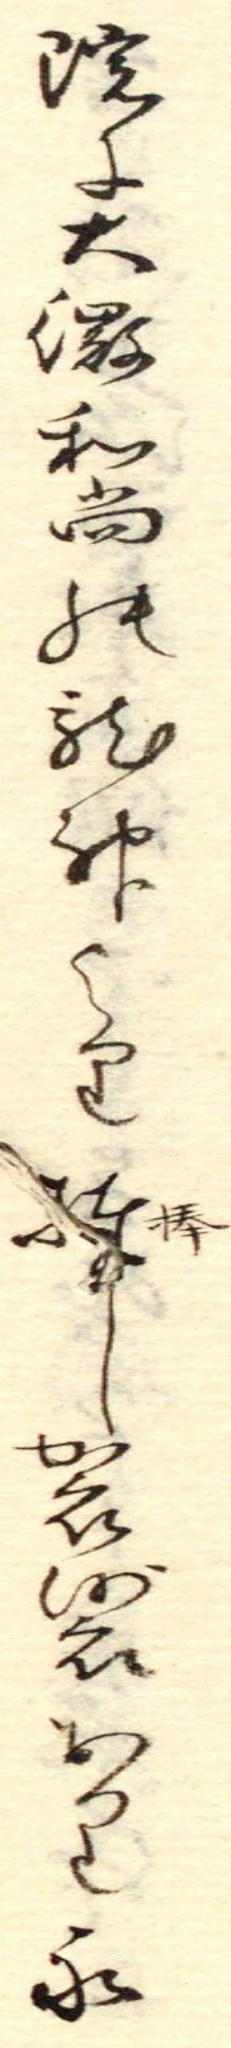院に大徴和尚の龍神より捧し袈裟あり永
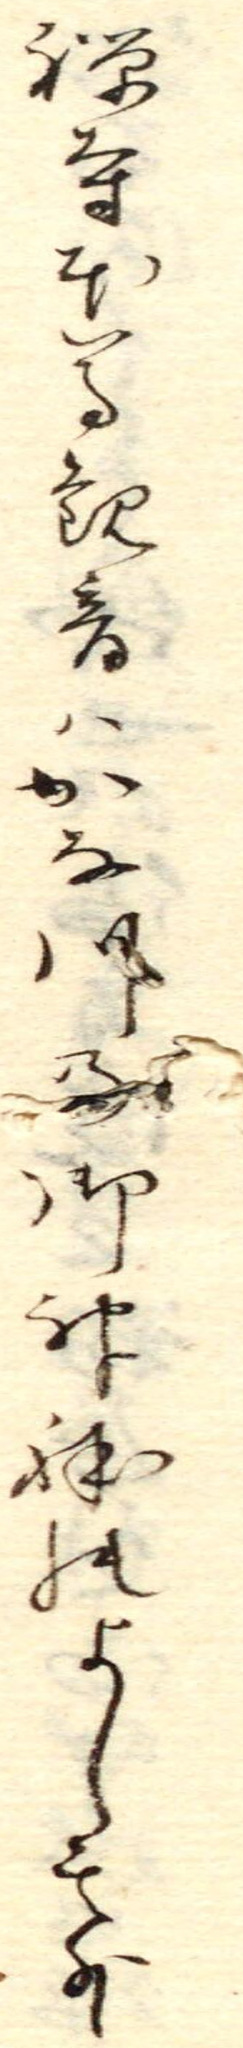禅寺本尊観音はかな川の御神躰のよし其外
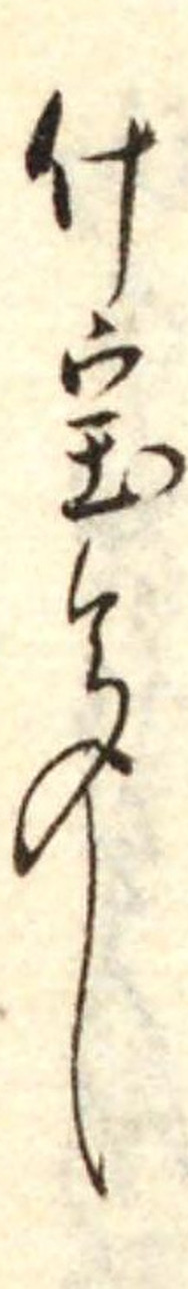什宝多し
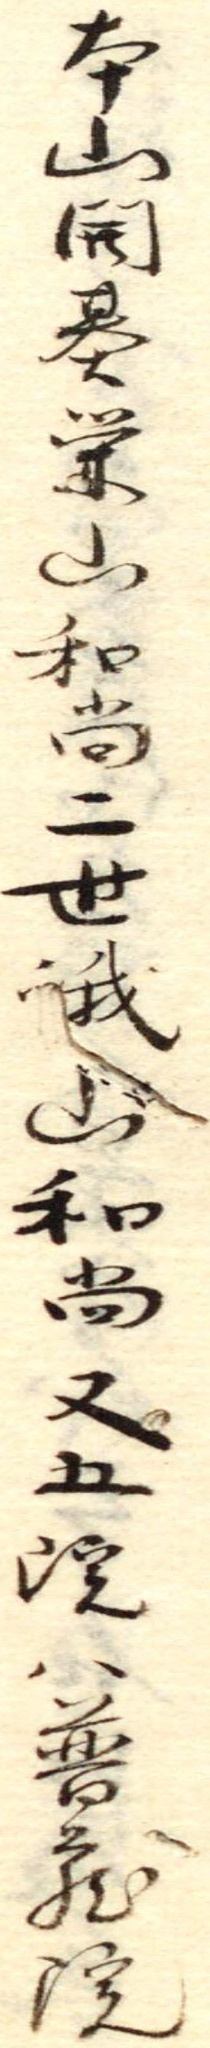本山開基栄山和尚二世峨山和尚又五院は普蔵院
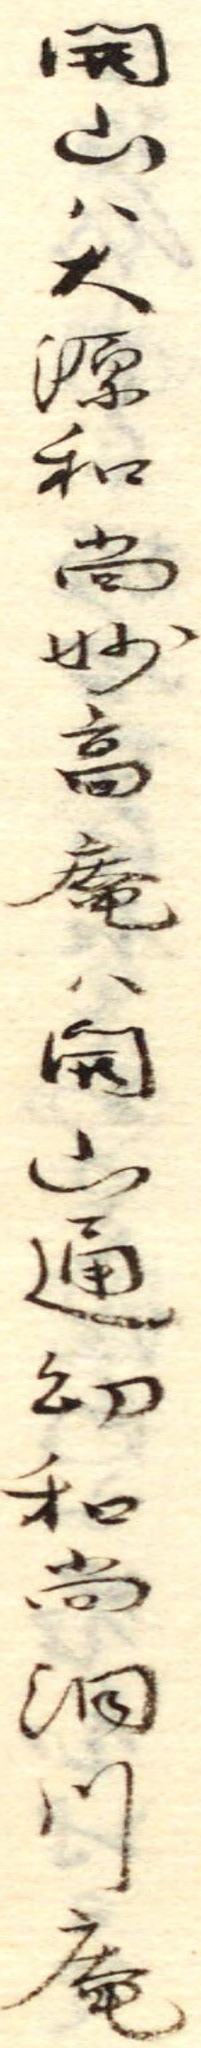開山は大源和尚妙高庵は開山通幼和尚洞川庵
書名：能登名跡誌
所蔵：Ishikawa Prefectural Library
